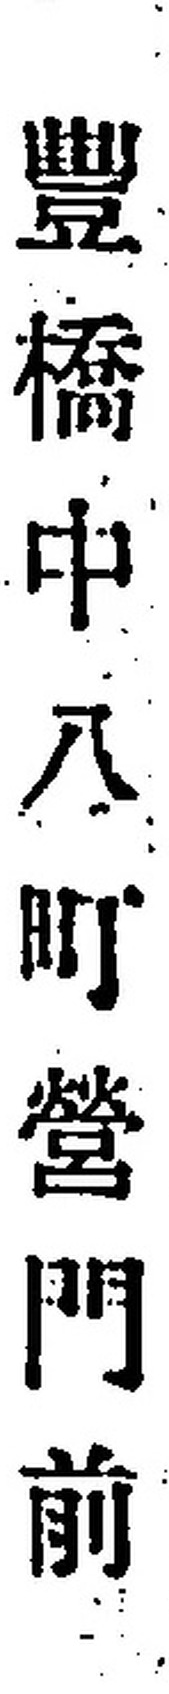豊橋中八町営門前
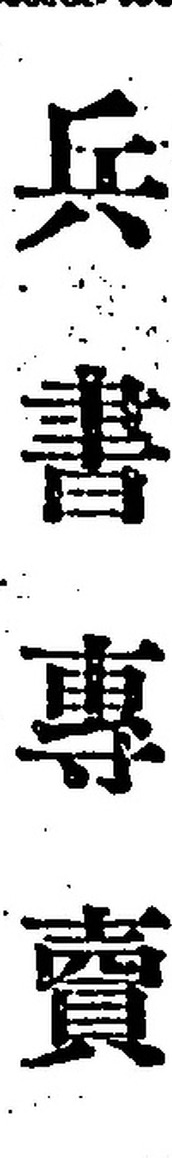兵書専売
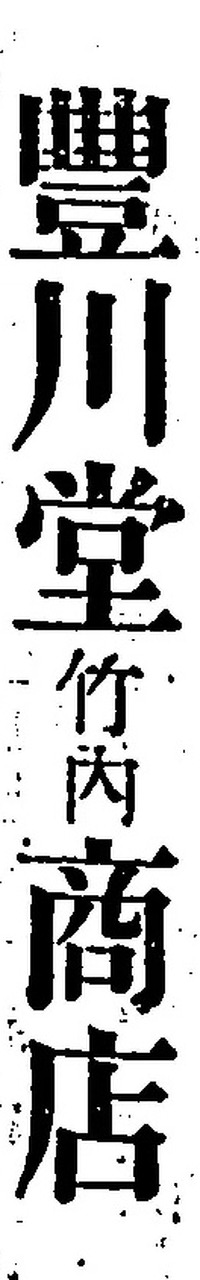豊川堂竹内商店
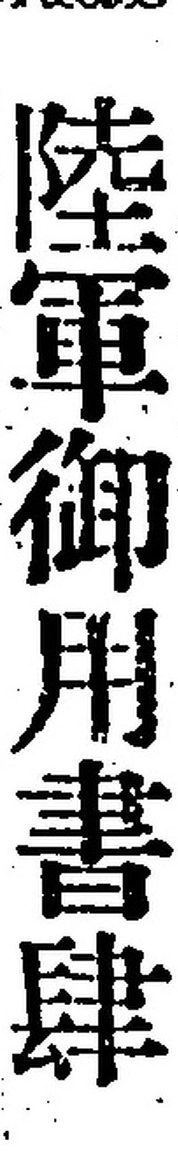陸軍御用書肆

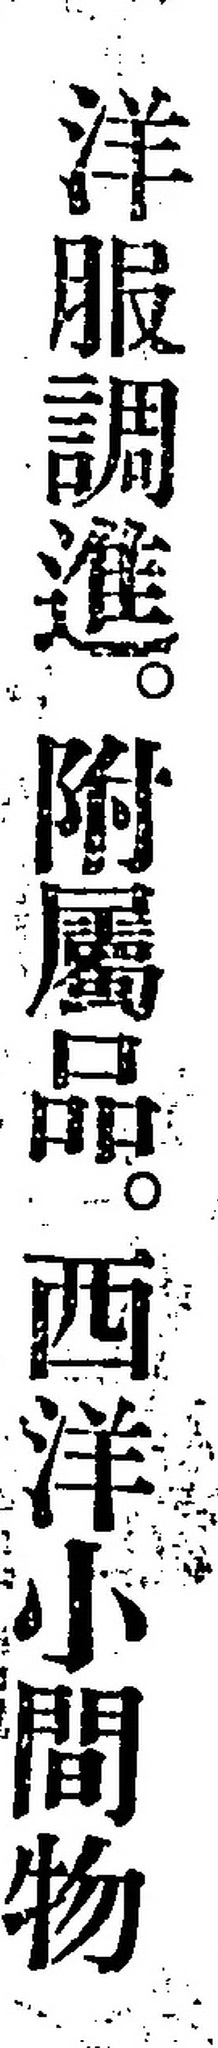洋服調進。附属品。西洋小間物
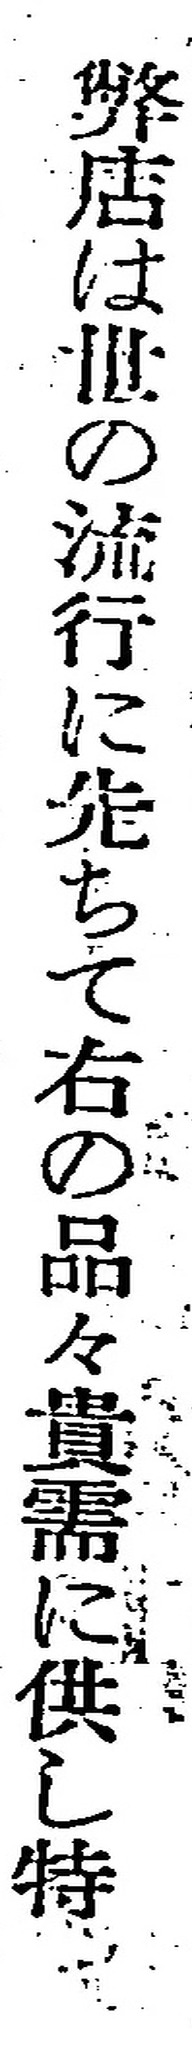弊店は世の流行に先ちて右の品々貴需に供し特
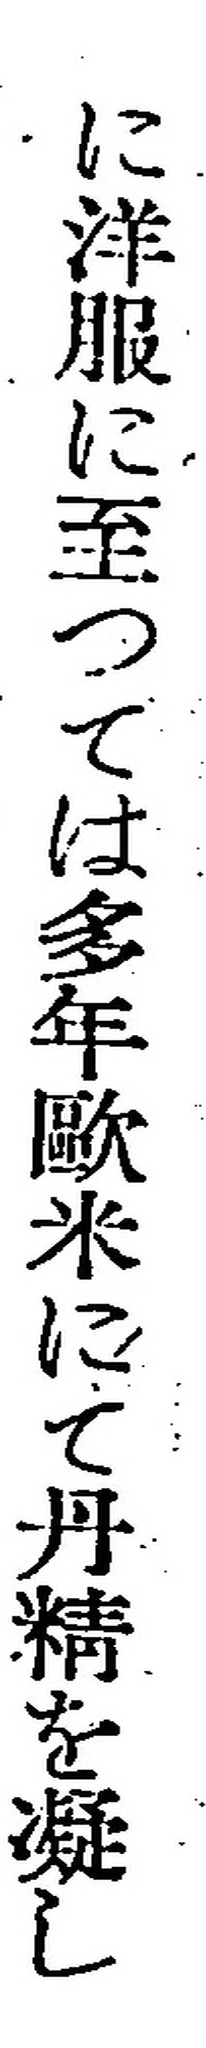に洋服に至つては多年欧米にて丹精を凝し
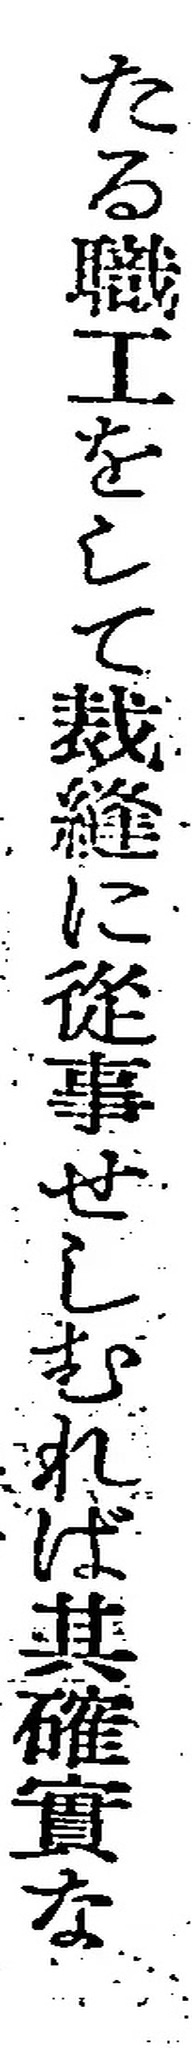たる職工をして裁縫に従事せしむれば其確実な
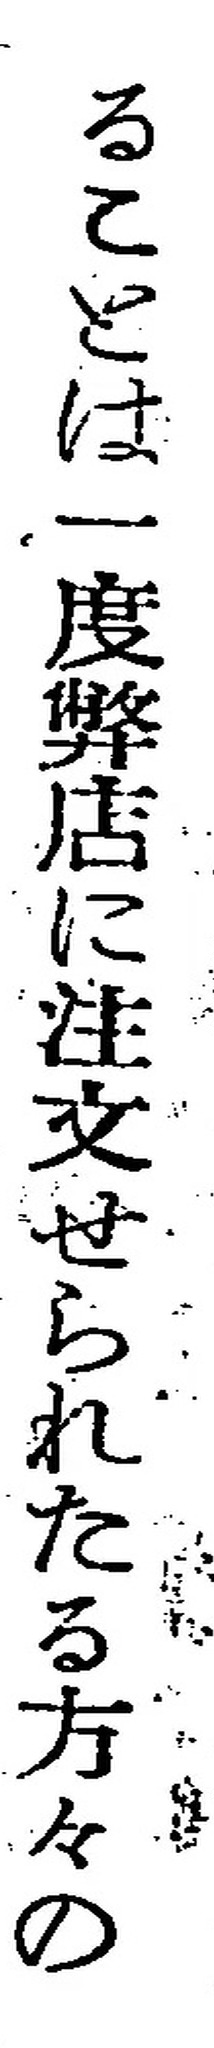ることは一度弊店に注文せられたる方々の
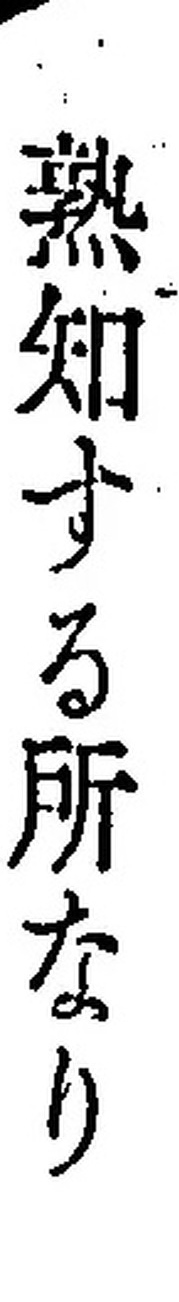熟知する所なり
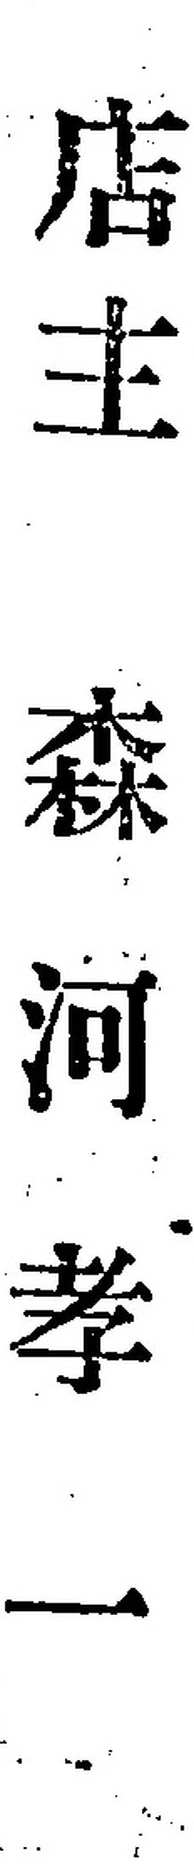店主森河孝一

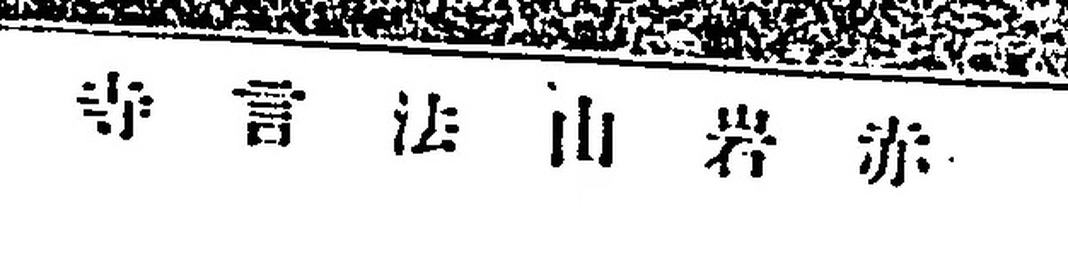赤岩山法言寺

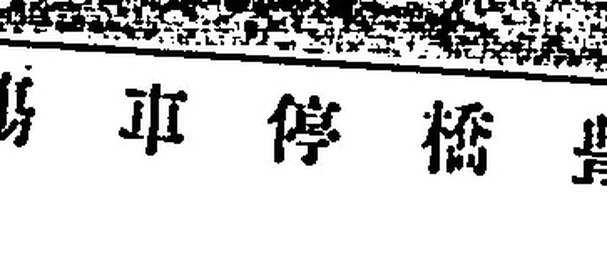豊橋停車場

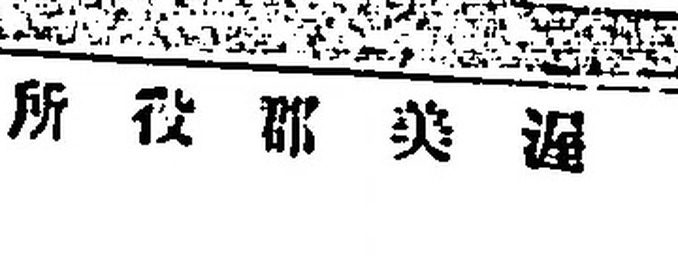渥美郡役所

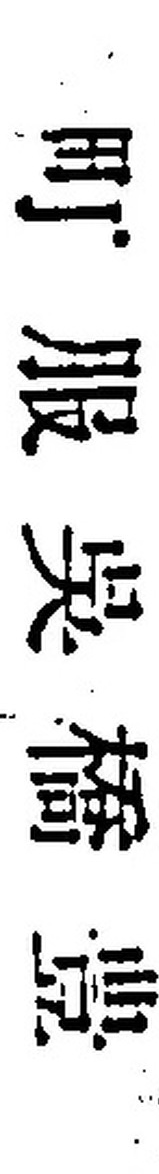豊橋呉服町
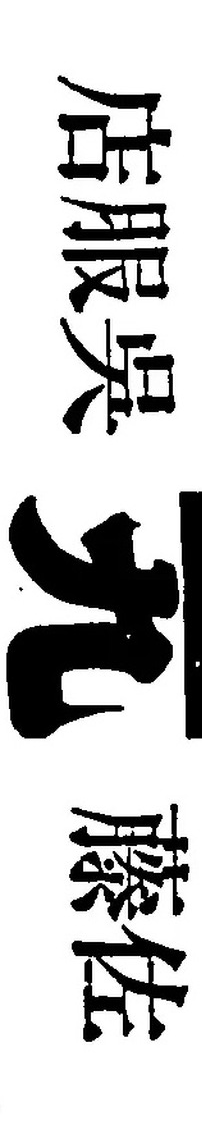佐藤呉服店
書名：東参名勝案内
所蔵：国立国会図書館 National Diet Library, JAPAN
